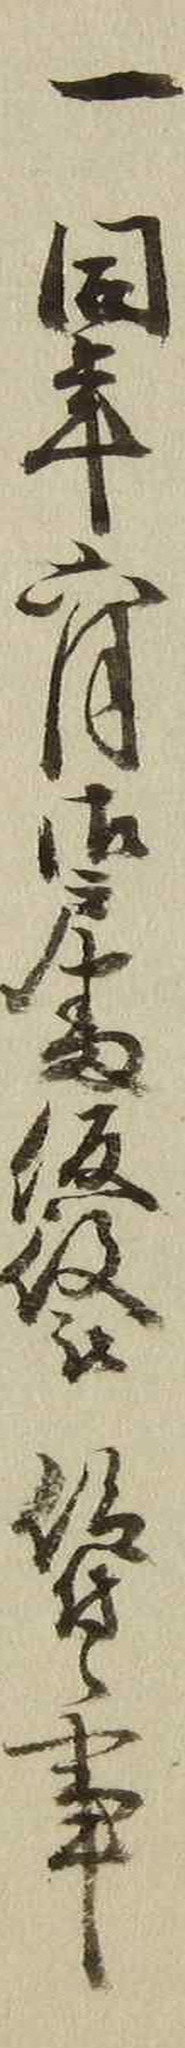一同年六月御戸番仮役被仰付候事
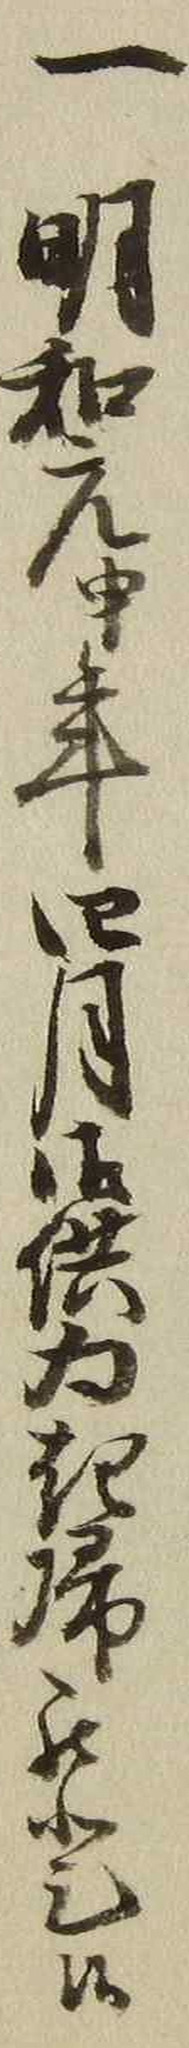一明和元申年四月御供為起帰罷登候
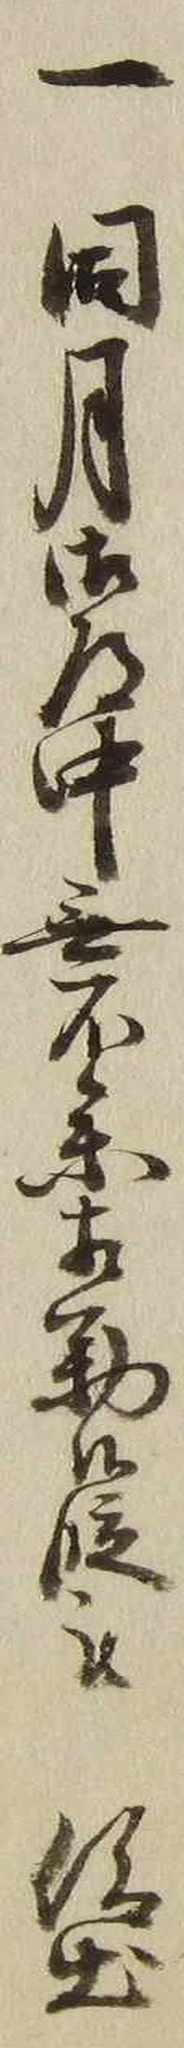一同月御道中無不参相勤候段被仰出
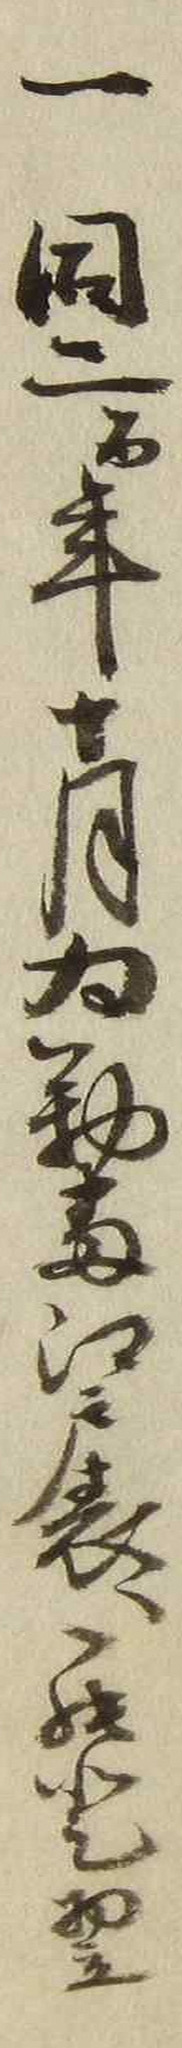一同二酉年十月為勤番江戸表へ罷登翌
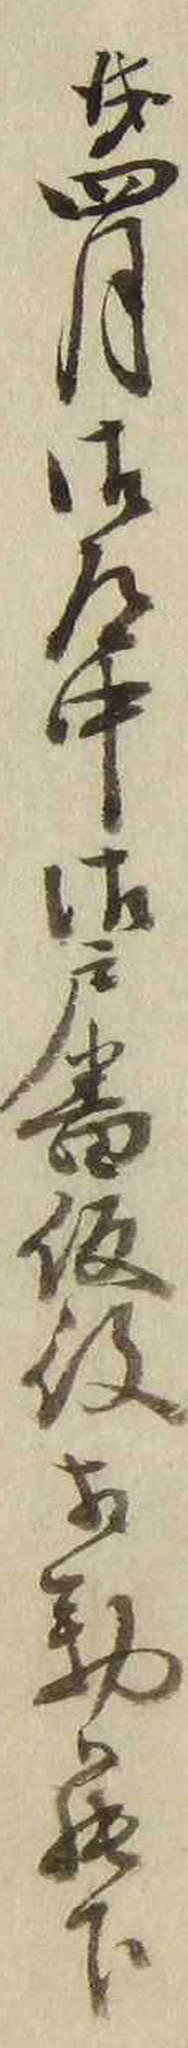戌四月御道中御戸番仮役相勤罷下

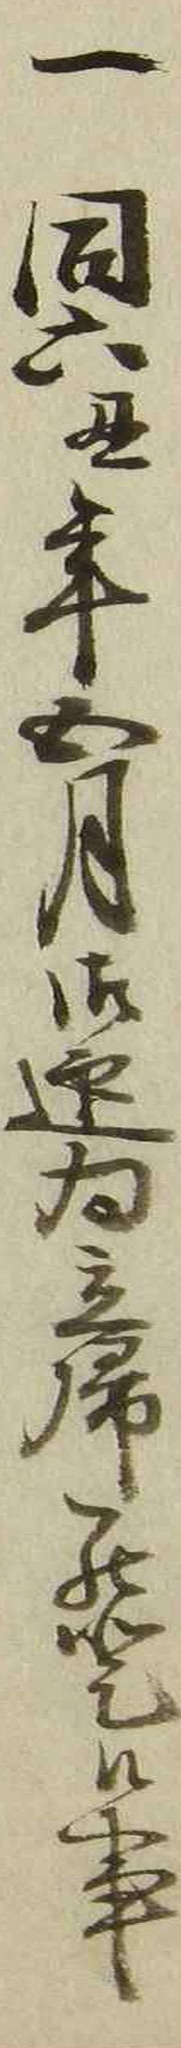一同六丑年五月御迎為立帰罷登候事
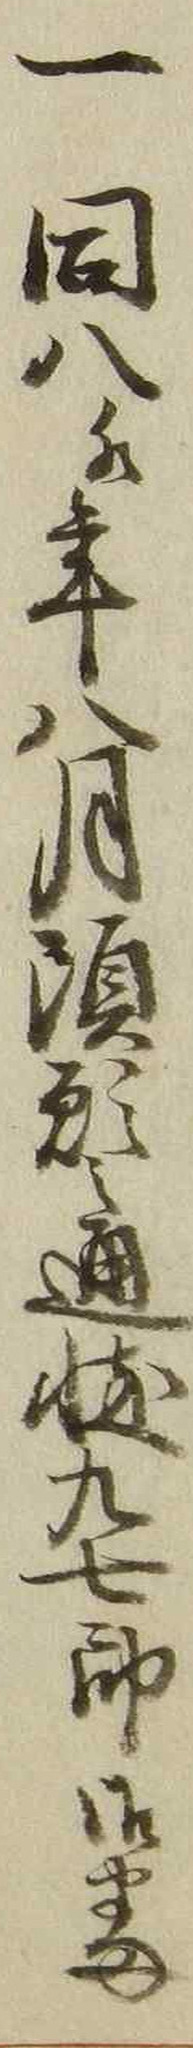一同八卯年八月頭願之通忰九七郎御番
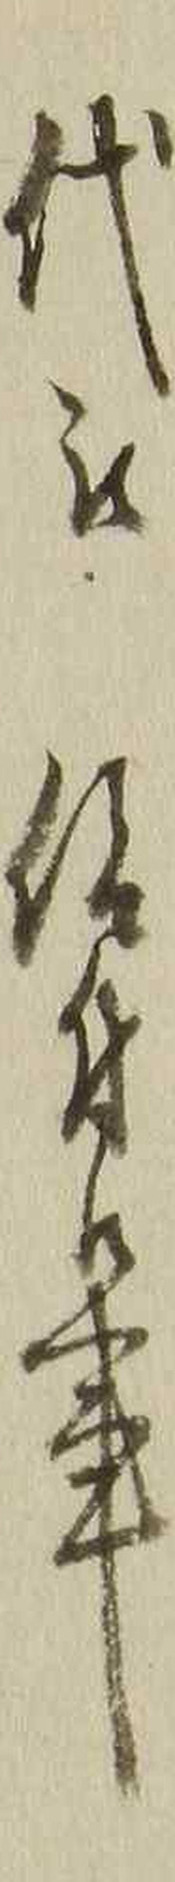代被仰付候事
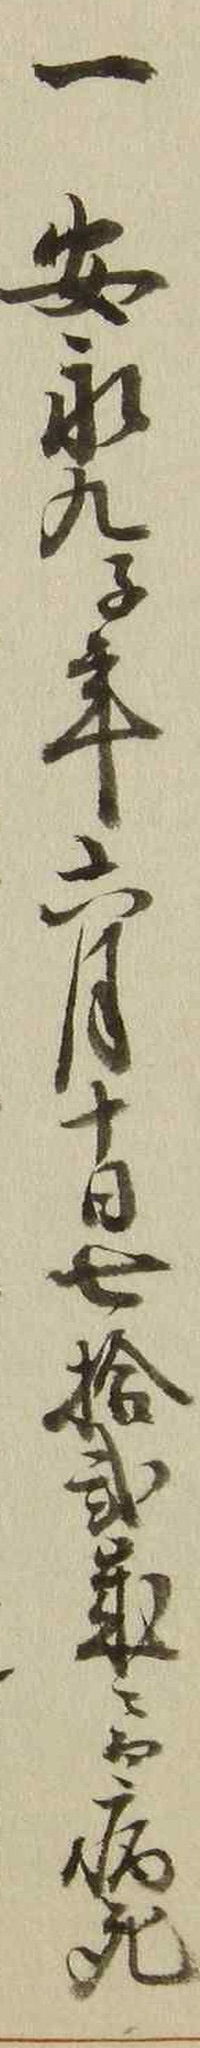一安永九子年六月十日七拾弐歳ニ而病死
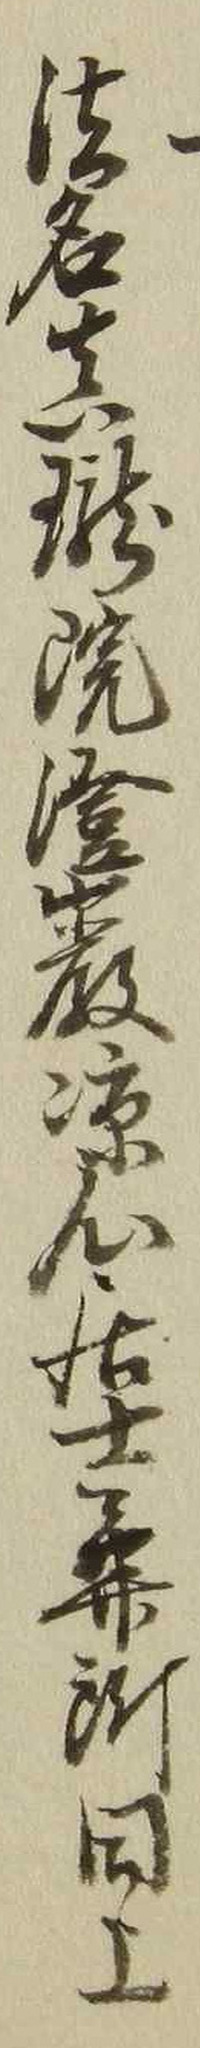法名真瓏院澄厳涼心居士葬所同上
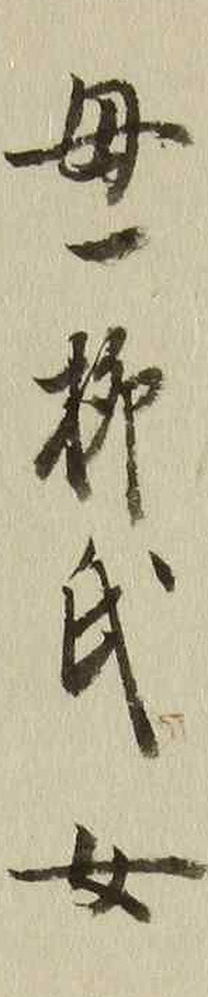母一柳氏女
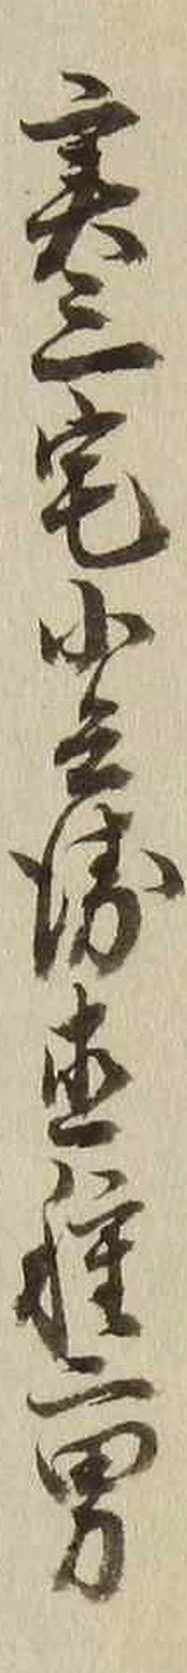実三宅小兵衛直種二男
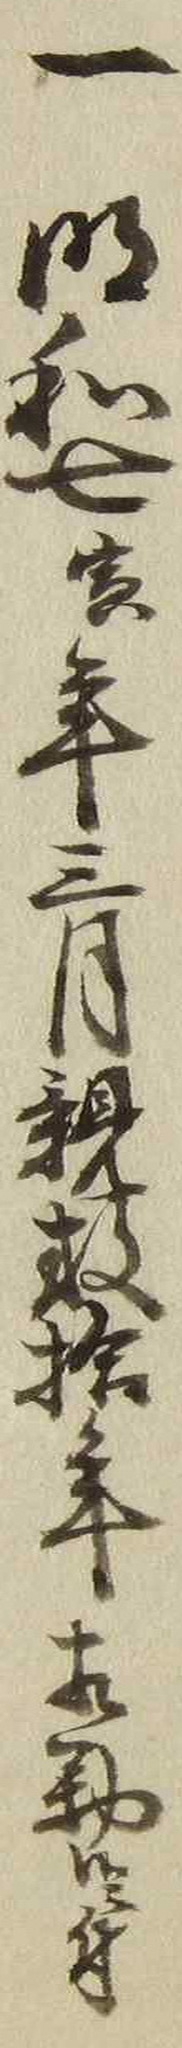一明和七寅年三月親数拾年相勤候ニ付
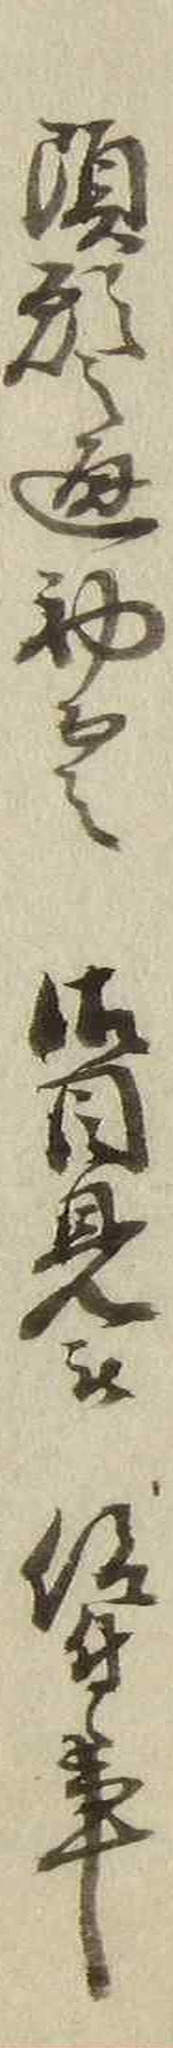頭願之通初而之御目見被仰付候事
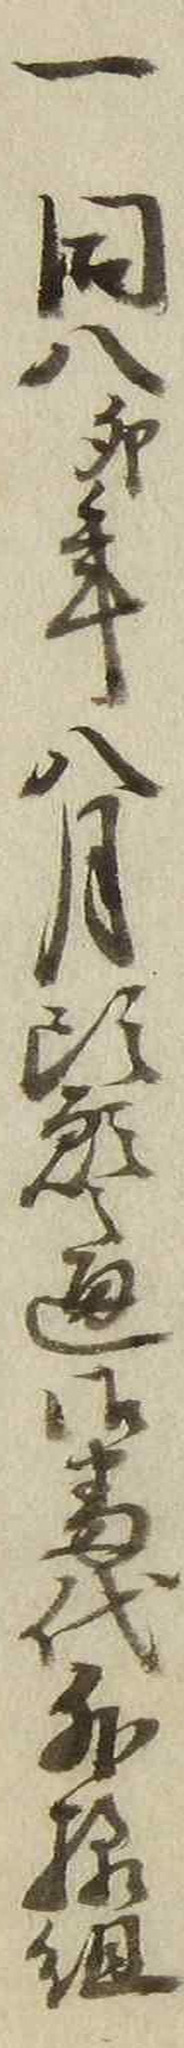一同八卯年八月頭願之通御番代外様組
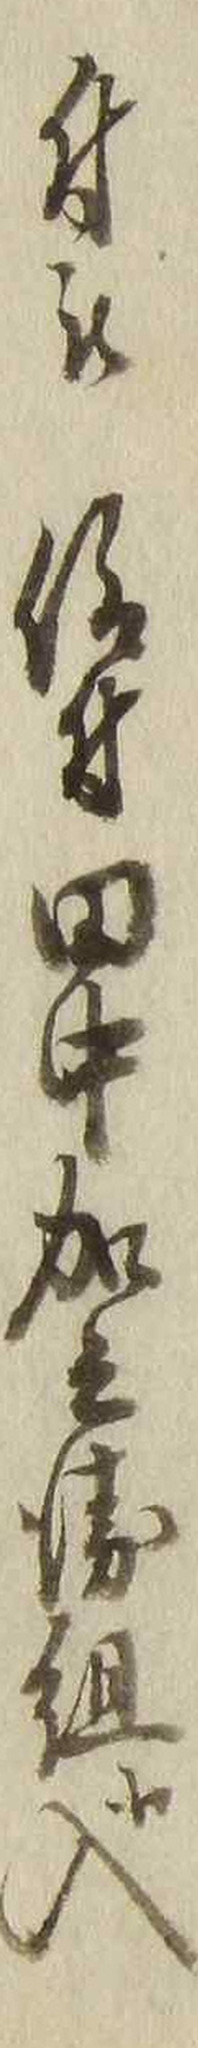付被仰付田中加兵衛組江入
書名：諸士系譜　巻之53　に之部4
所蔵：会津若松市立会津図書館
